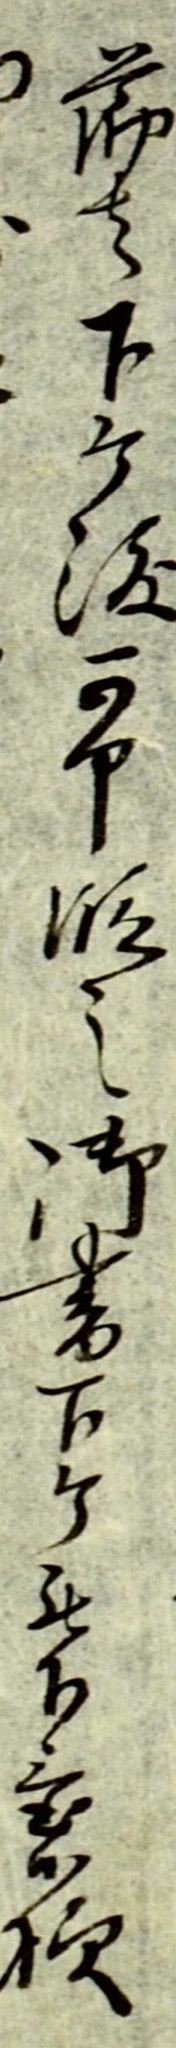筋者下ケ渡可申段之御書下ケ被下置候様
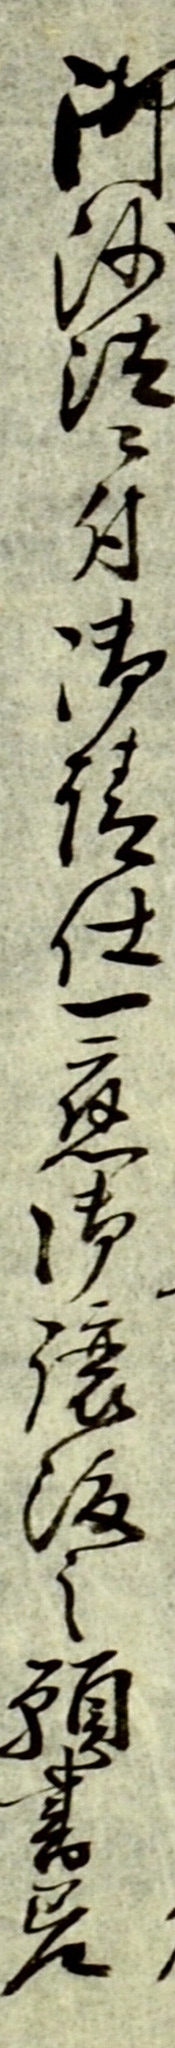御沙汰ニ付御請仕一応御譲渡之願書差
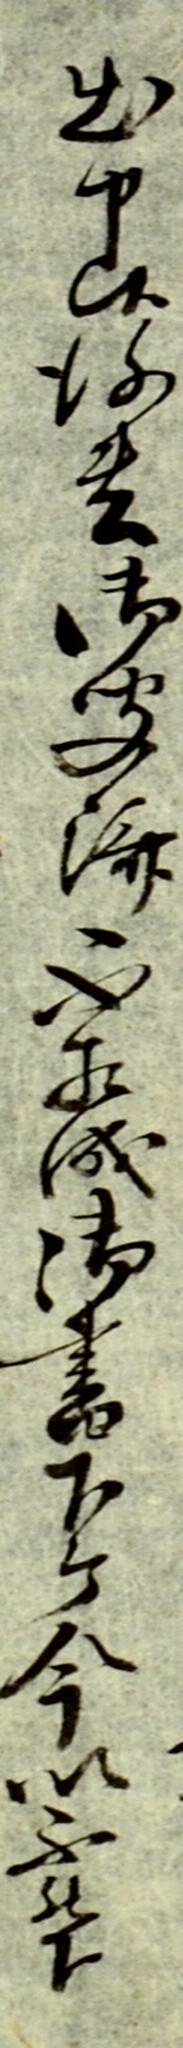出申候得共御聞済不相成御書下ケ今以不被下
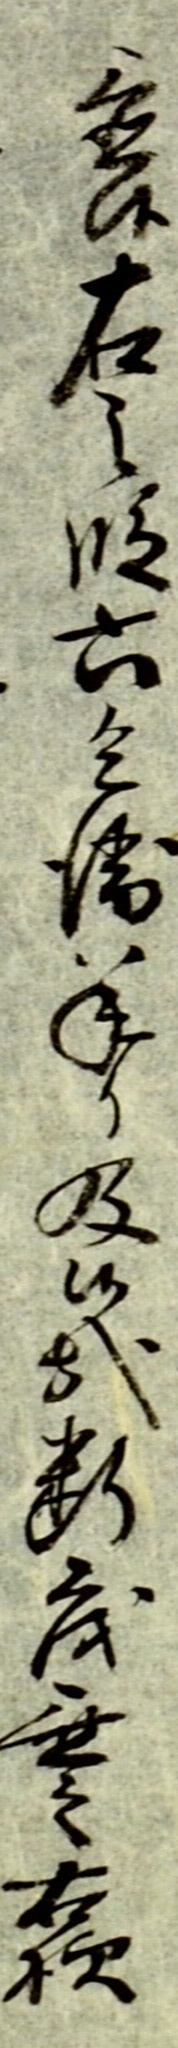置候右之段六兵衛承り及候哉断茂無之右様
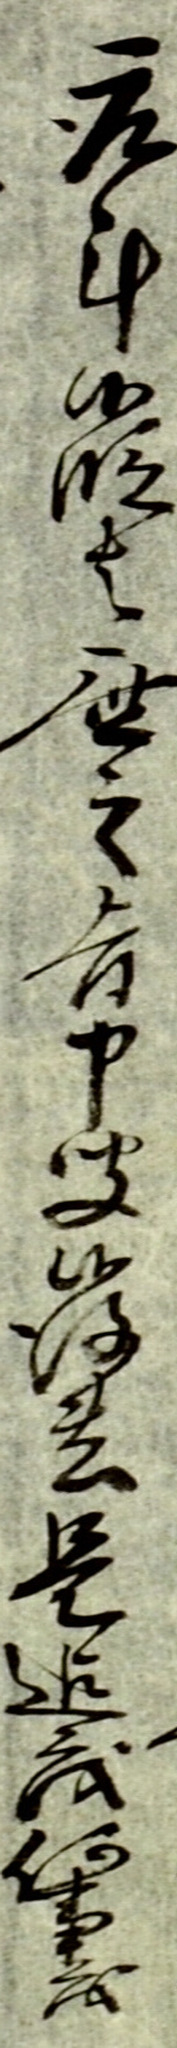取斗候段者無之旨申聞候得共是迄茂何事茂
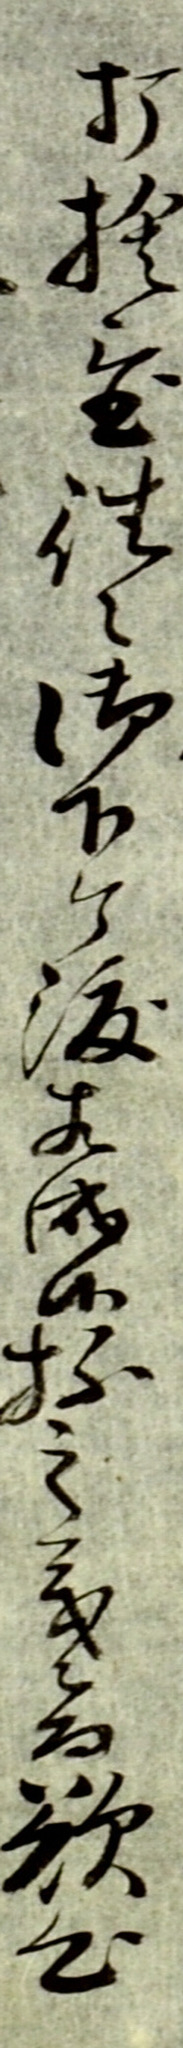打捨置往々御下ケ渡相成候抔之義ニ而歎心
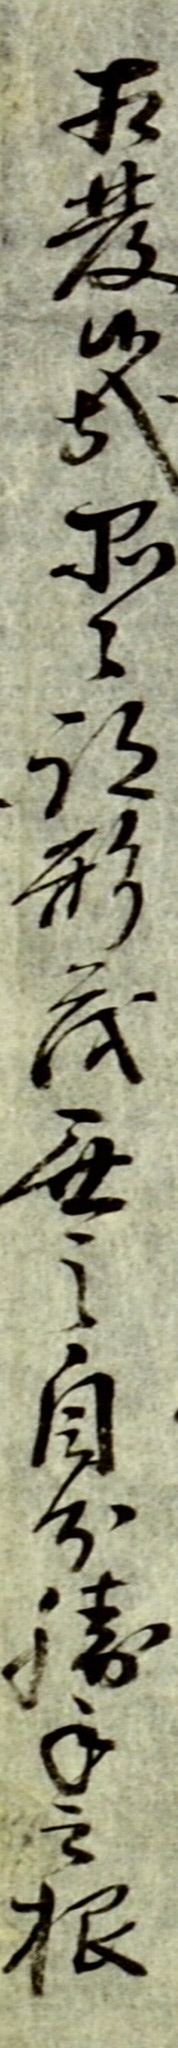相発候哉品々跡形茂無之自分勝手之根
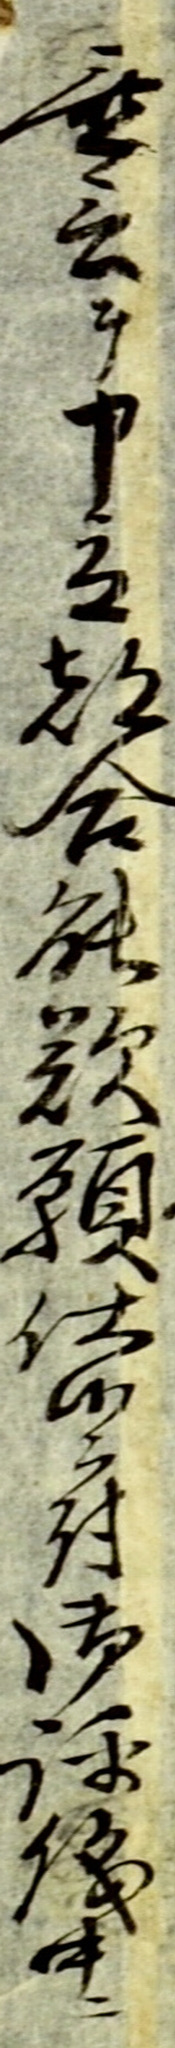無言ヲ申立都合能歎願仕候ニ付御評議中ニ
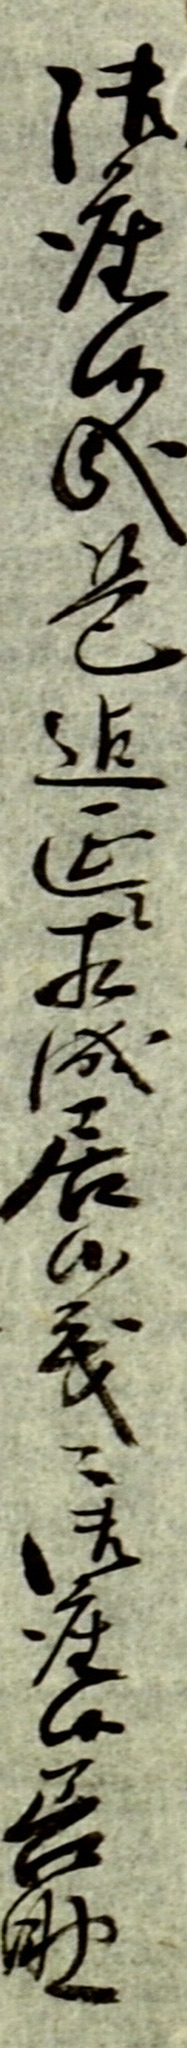御座候哉是迄延シ相成居候義ニ御座候善助
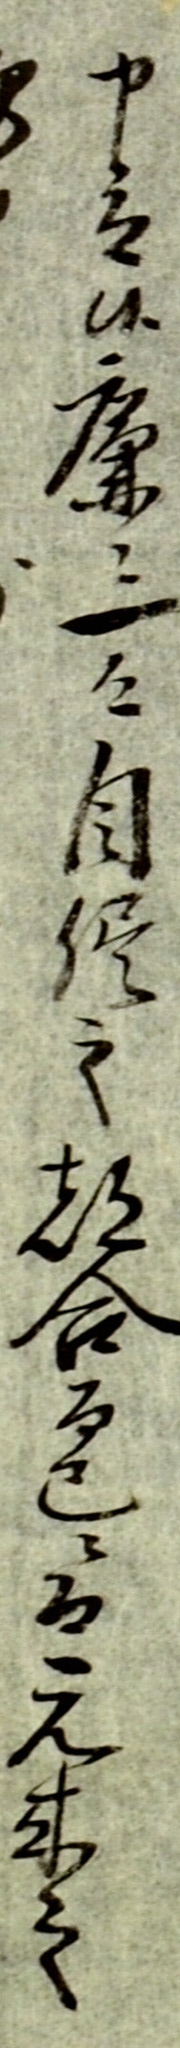申立候廉々一々自儘之都合而已元来之
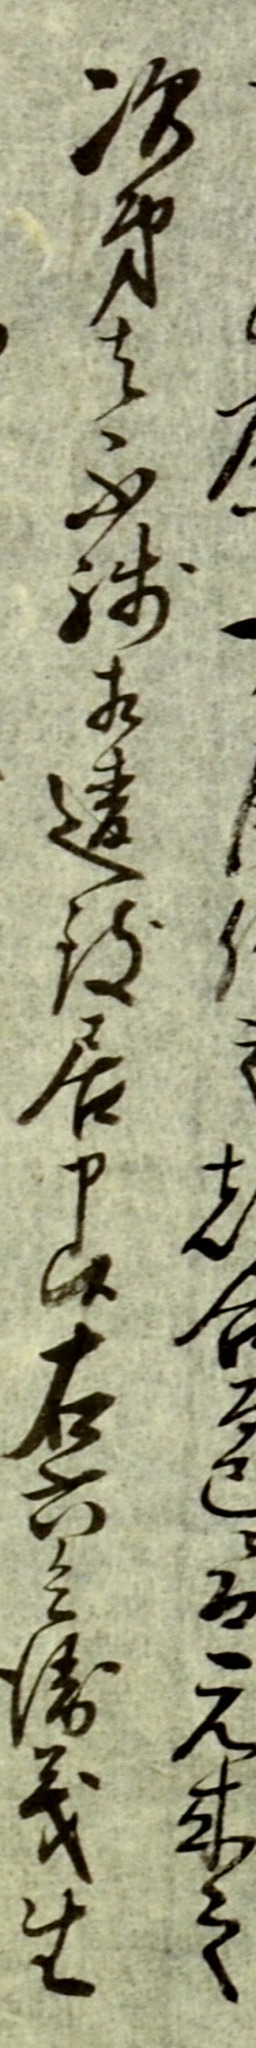次第者不残相違致居申候右六兵衛義生
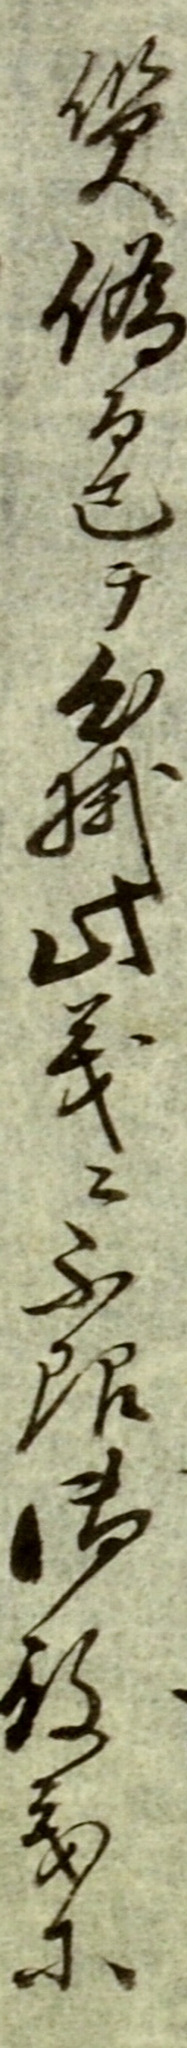質偽而已ヲ心掛此義ニ不限御役義に
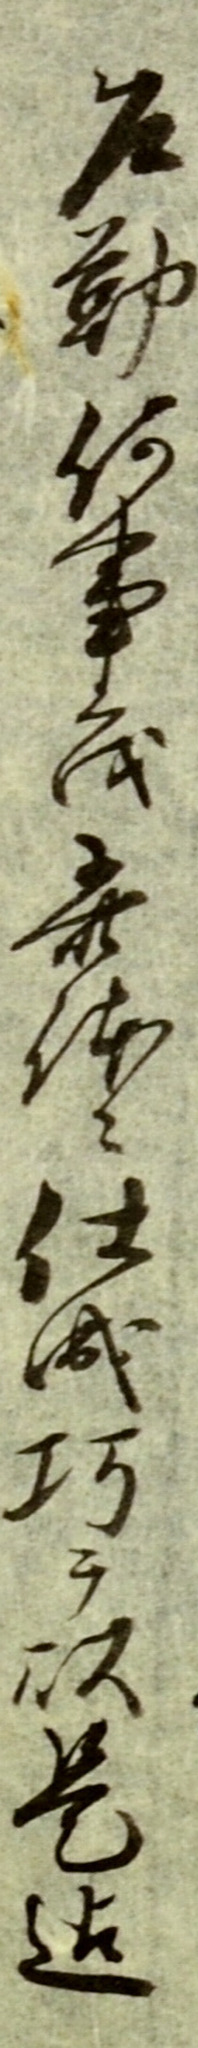乍勤何事も此体ニ仕成巧ヲ以是迄
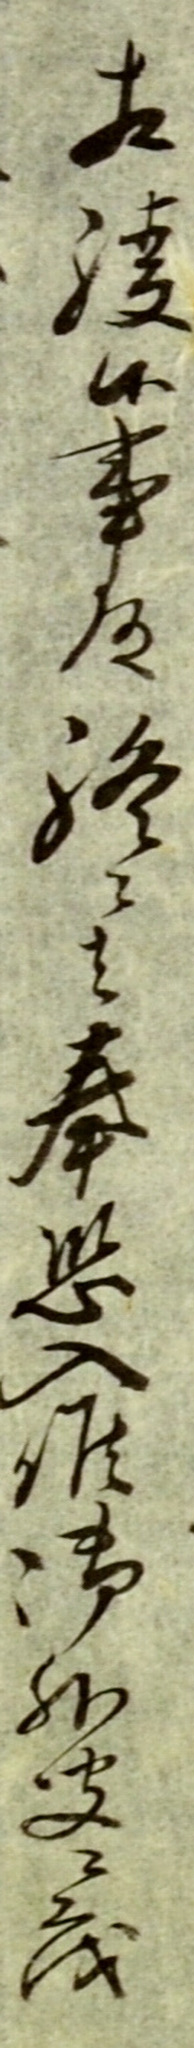相談候事故終ニ者奉恐入候外聞ニ茂
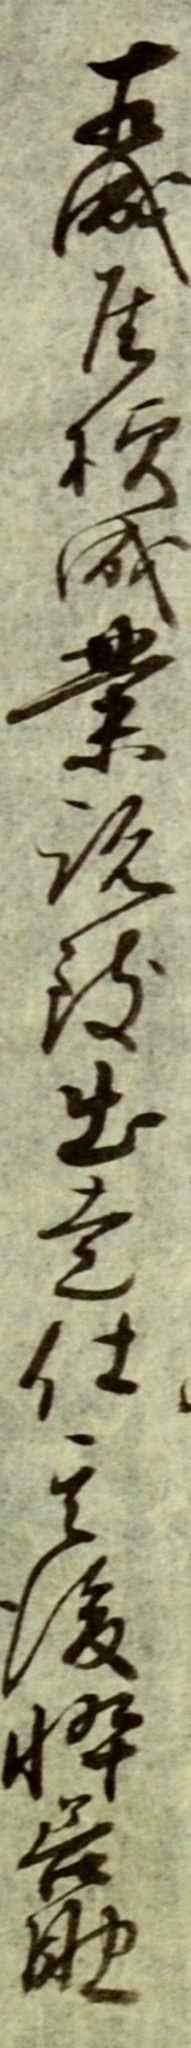相成候様成業説致出走仕其後倅善助
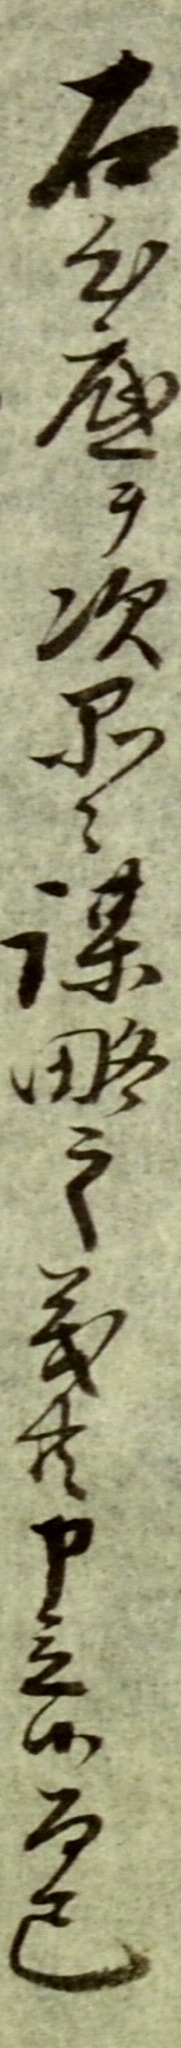右心底ヲ次品々謀略之義共申立候而已
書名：乍恐以口上書奉申上候御事
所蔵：伊那市立高遠町図書館・合同会社AMANE
